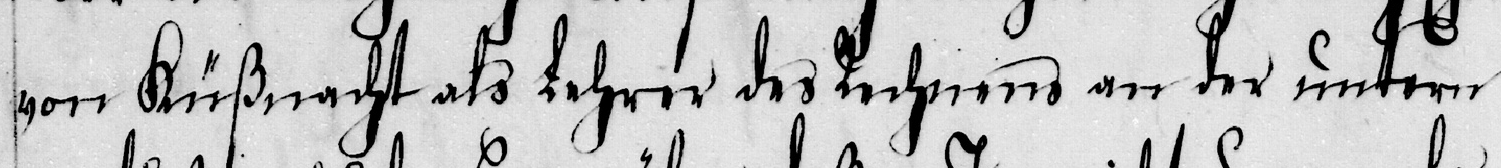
von Küßnacht als Lehrer des Rechnens an der untern
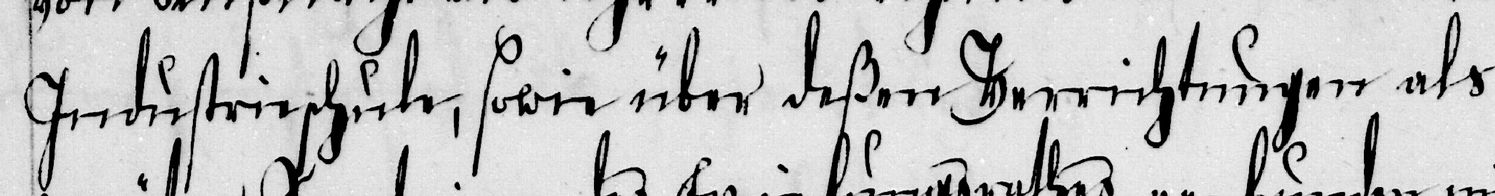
Industrieschule, sowie über deßen Verrichtungen als
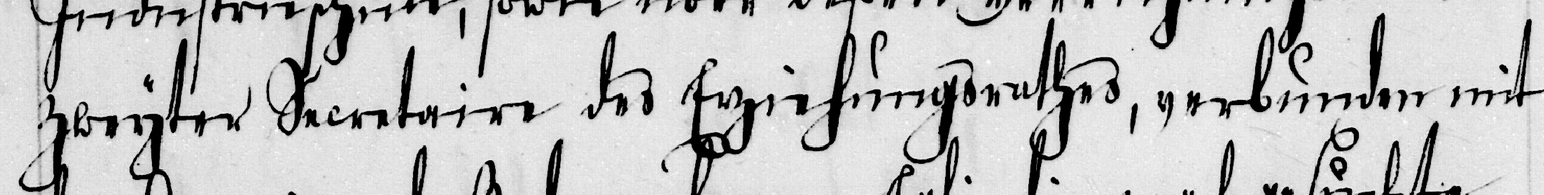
zweyter Secretaire des Erziehungsrathes, verbunden mit
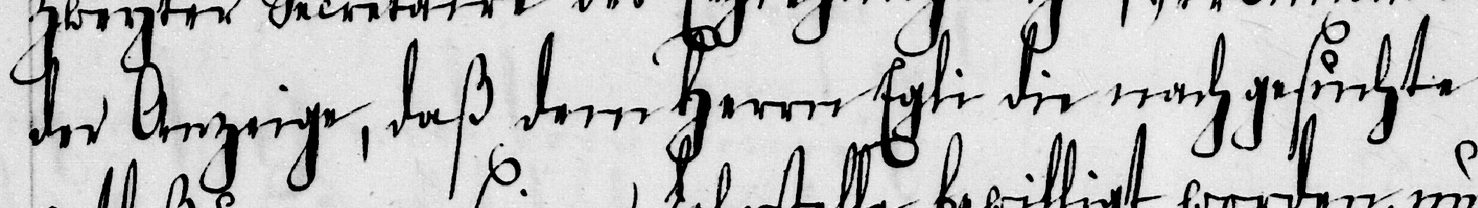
der Anzeige, daß dem Herrn Egli die nachgesuchte
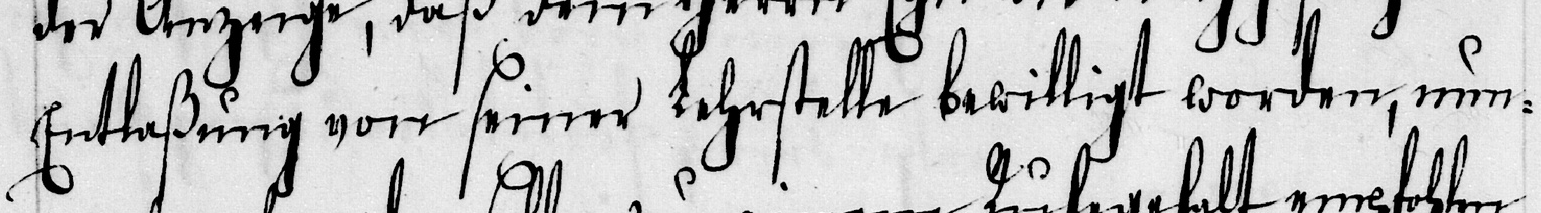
Entlaßung von seiner Lehrstelle bewilligt worden, nun¬
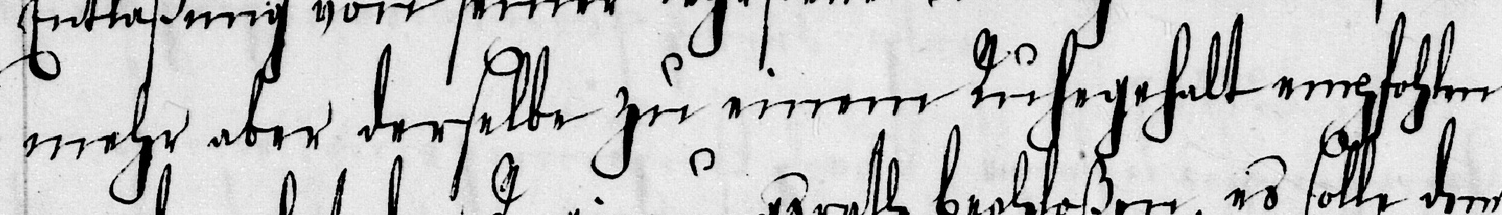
mehr aber derselbe zu einem Ruhegehalt empfohlen
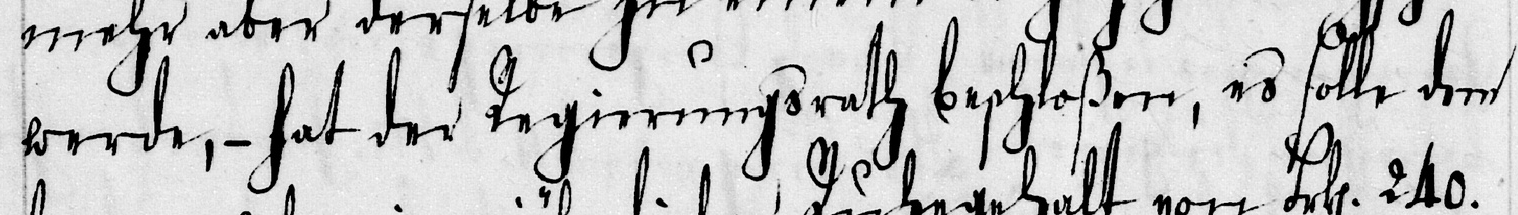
werde,– hat der Regierungsrath beschloßen, es solle dem
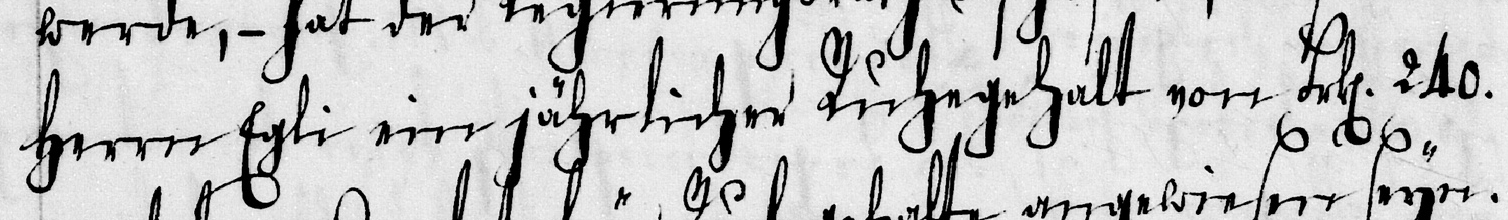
Herrn Egli ein jährlicher Ruhegehalt von Frk[en]. 240.
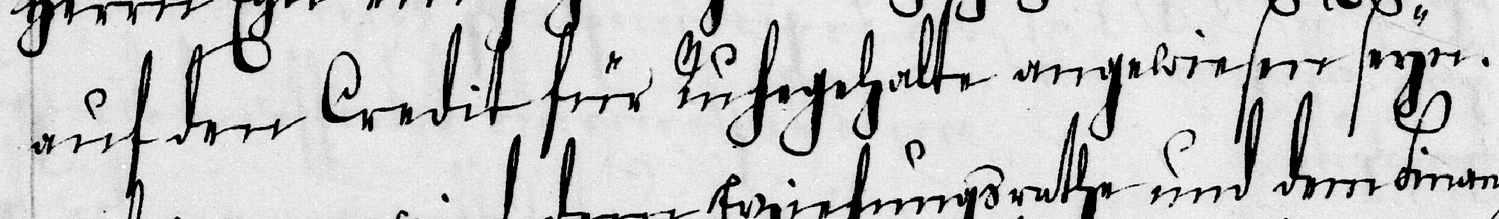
auf den Credit für Ruhegehalte angewiesen seyn.
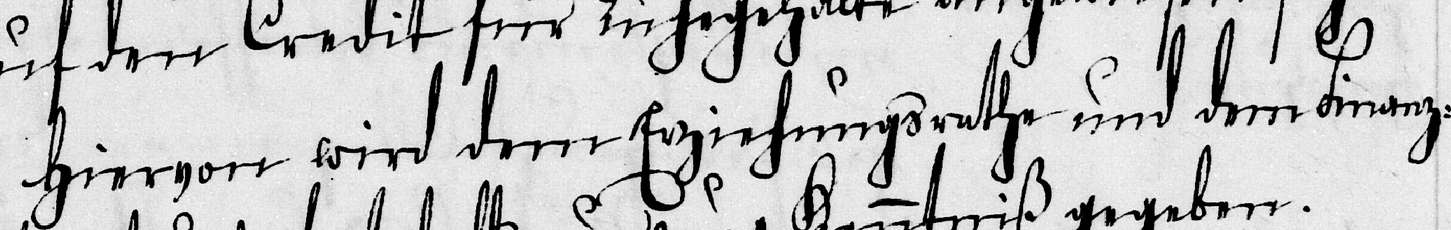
Hiervon wird dem Erziehungsrathe und dem Finanz¬
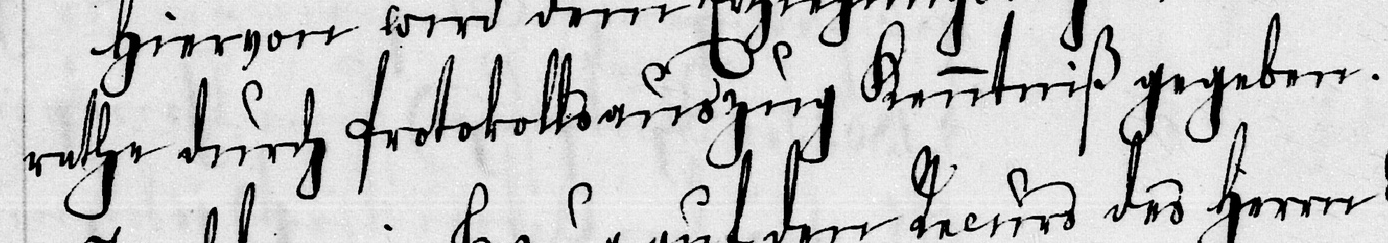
rathe durch Protokollsauszug Kenntniß gegeben.
